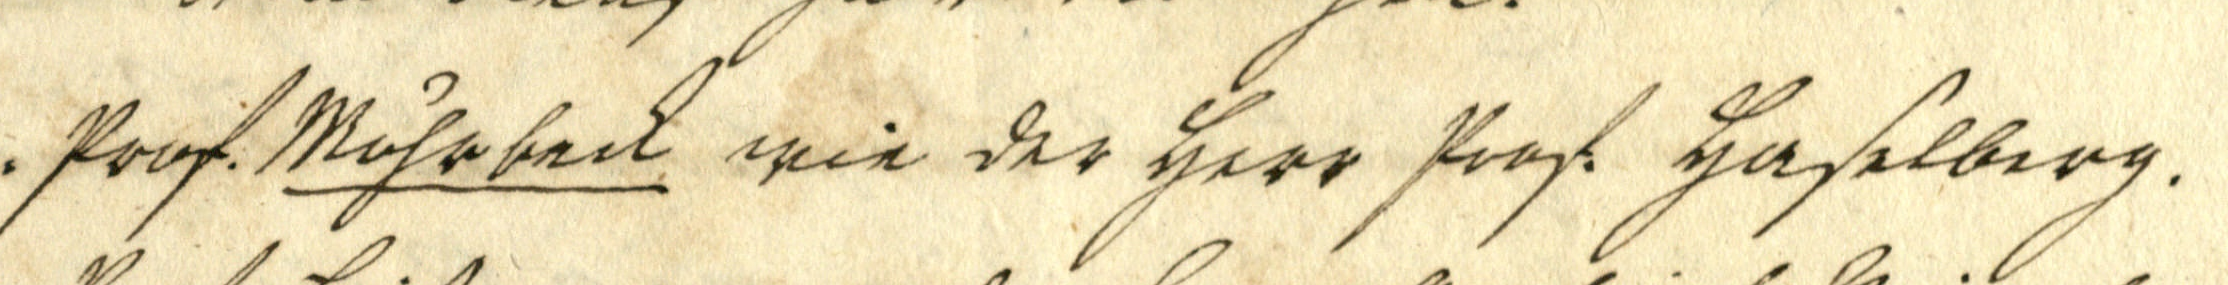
Prof. Muhrbeck wie der Herr Prof. Haselberg.
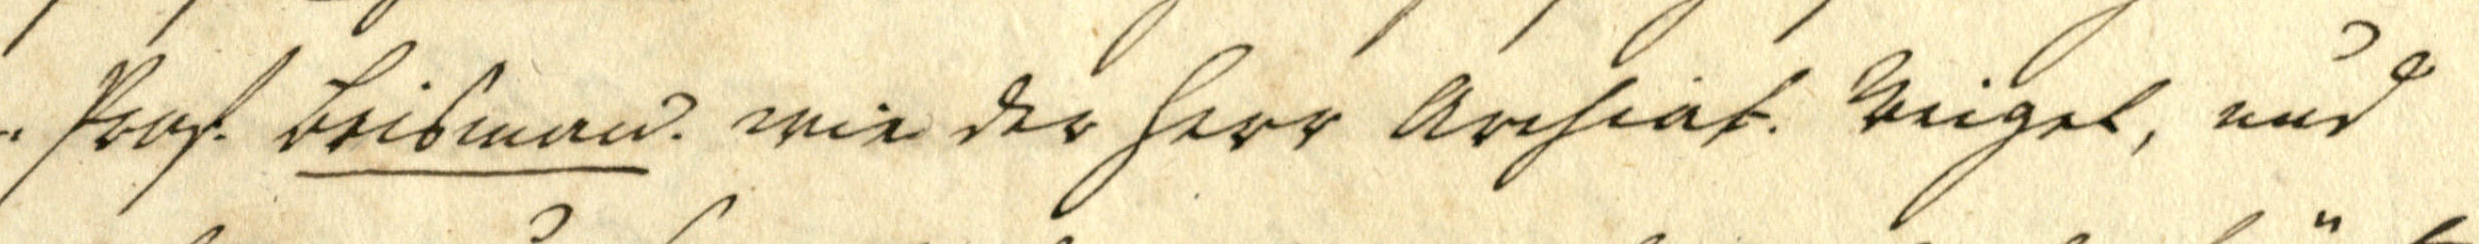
Prof. Brismann. wie der Herr Archiat. Weigel, und
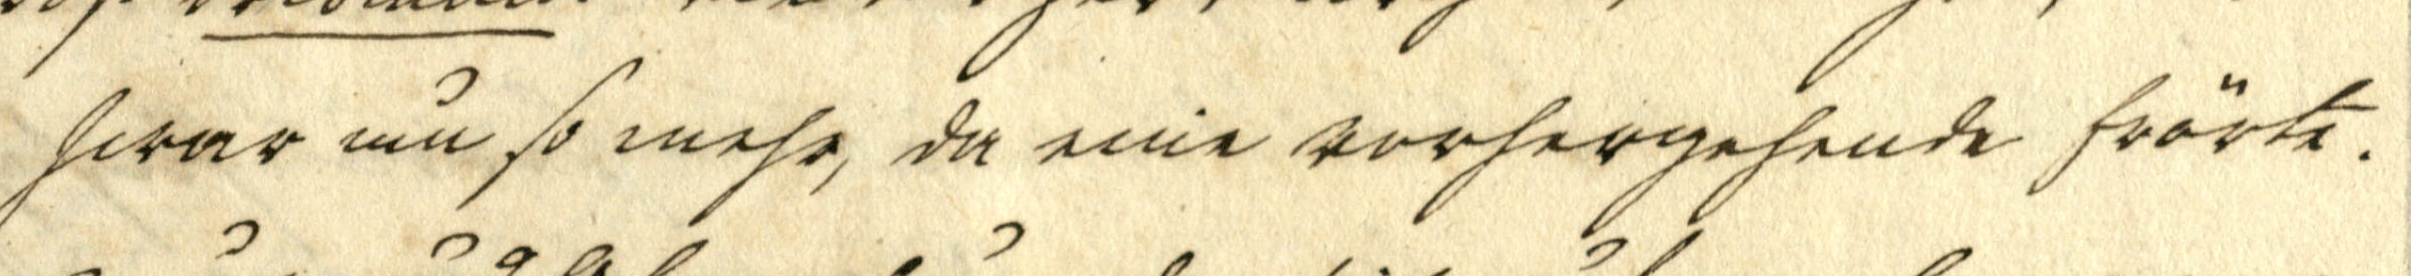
zwar um so mehr, da eine vorhergehende Erörte¬
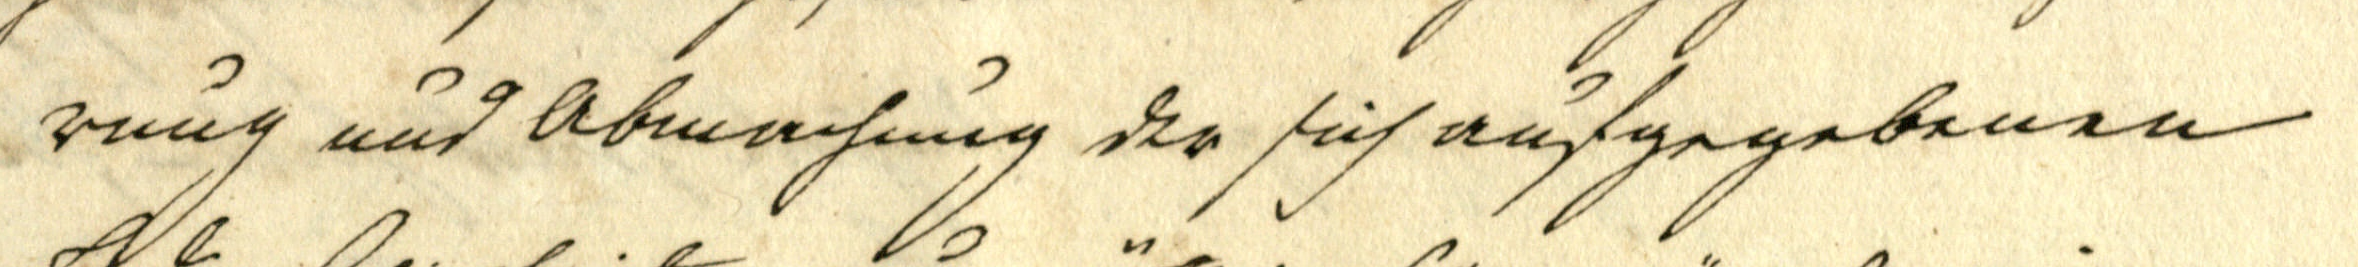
rung und Abmachung der sich aufgegebenen
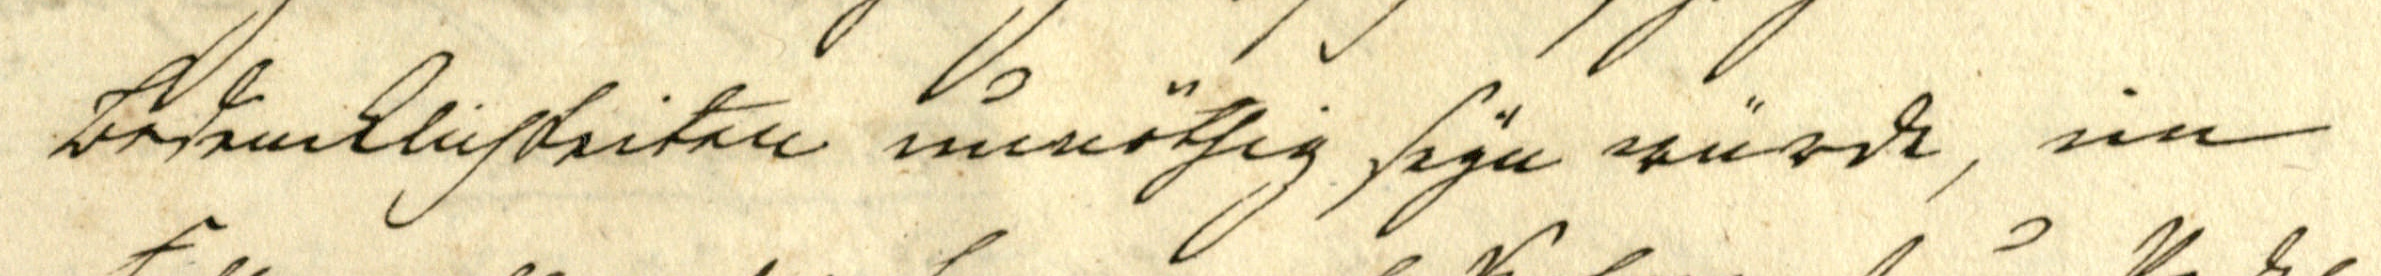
Bedencklichkeiten nöthig seyn würde, im
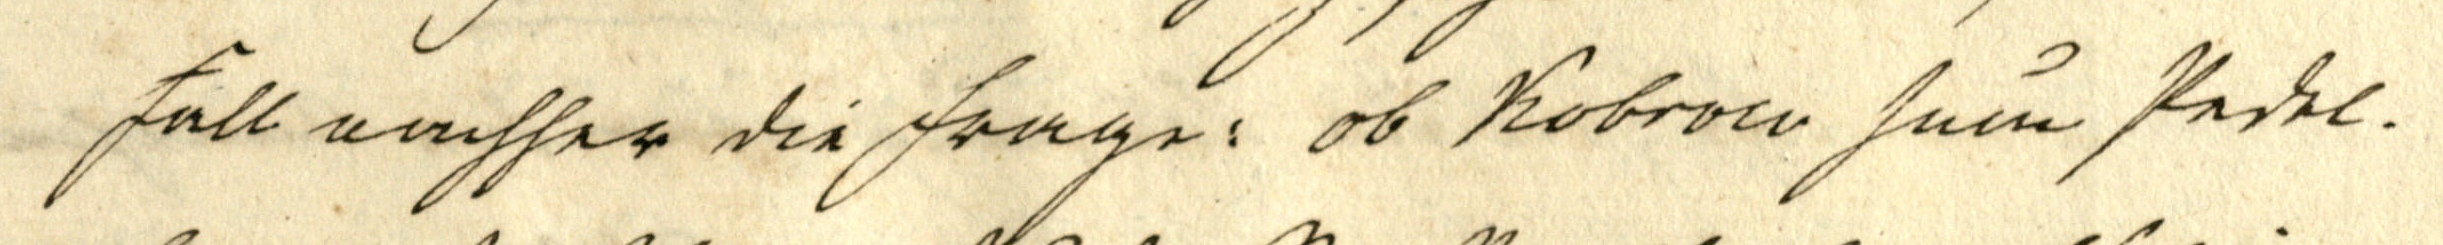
Fall nachher die Frage: ob Kobrow zum Pedel¬
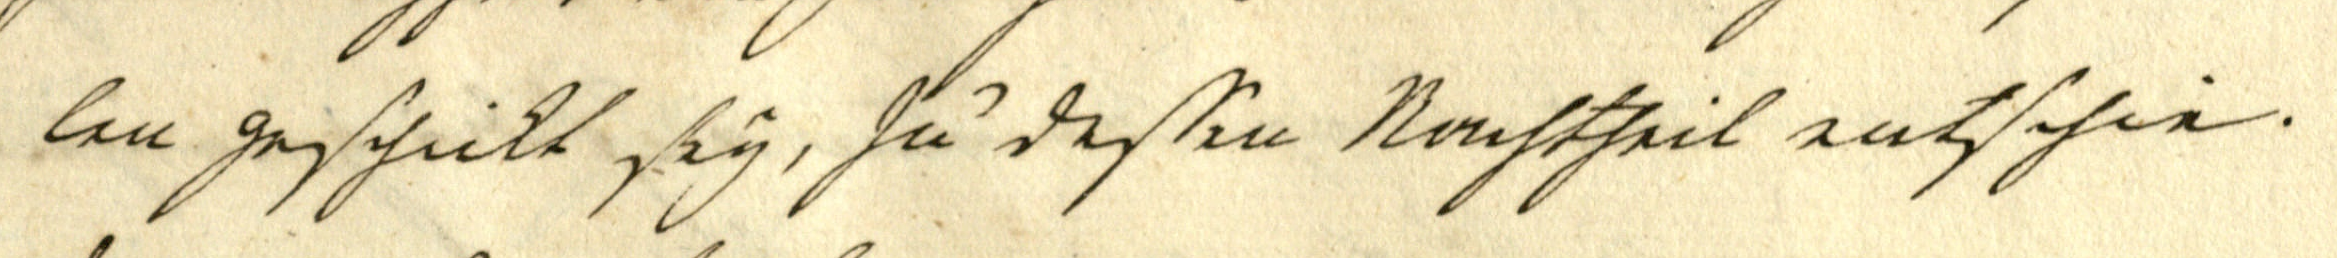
len geschickt seÿ, zu dessen Nachtheil entschie¬
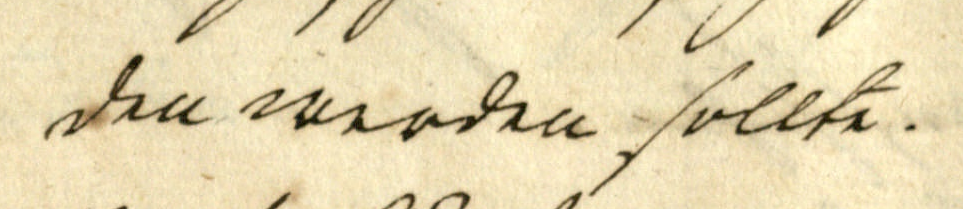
den werden sollte.
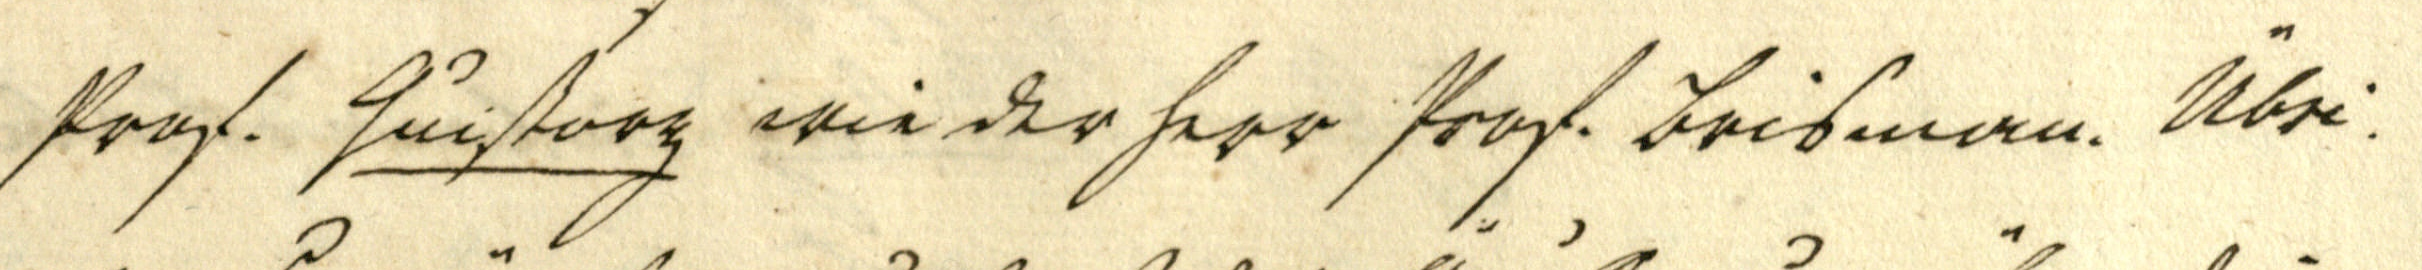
Prof. Quistorp wie der Herr Prof. Brisman. Übri¬
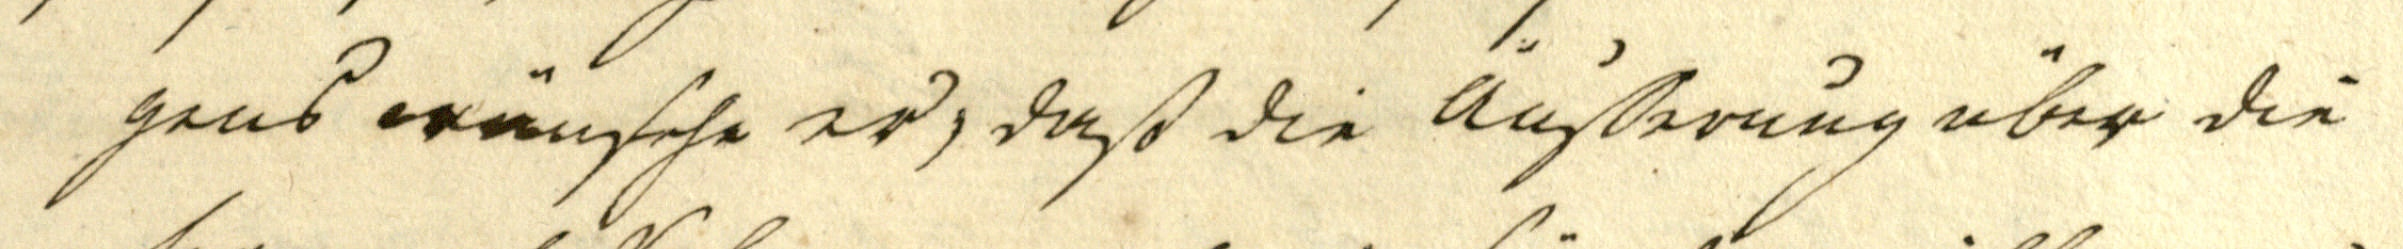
gens wünsche er, daß die Äusserung über die
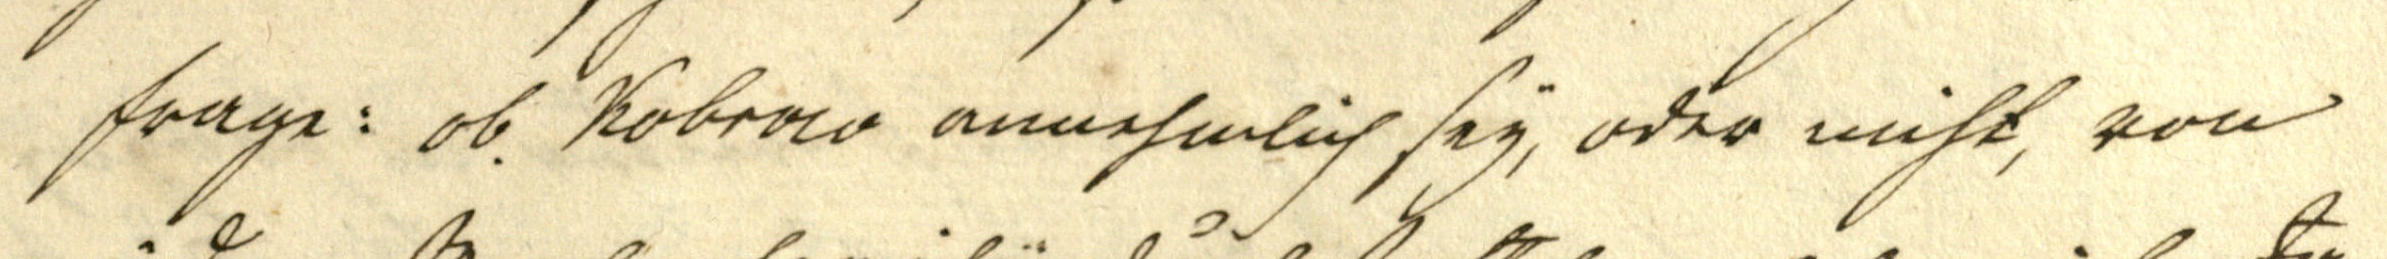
Frage: ob Kobrow annehmlich seÿ, oder nicht, von
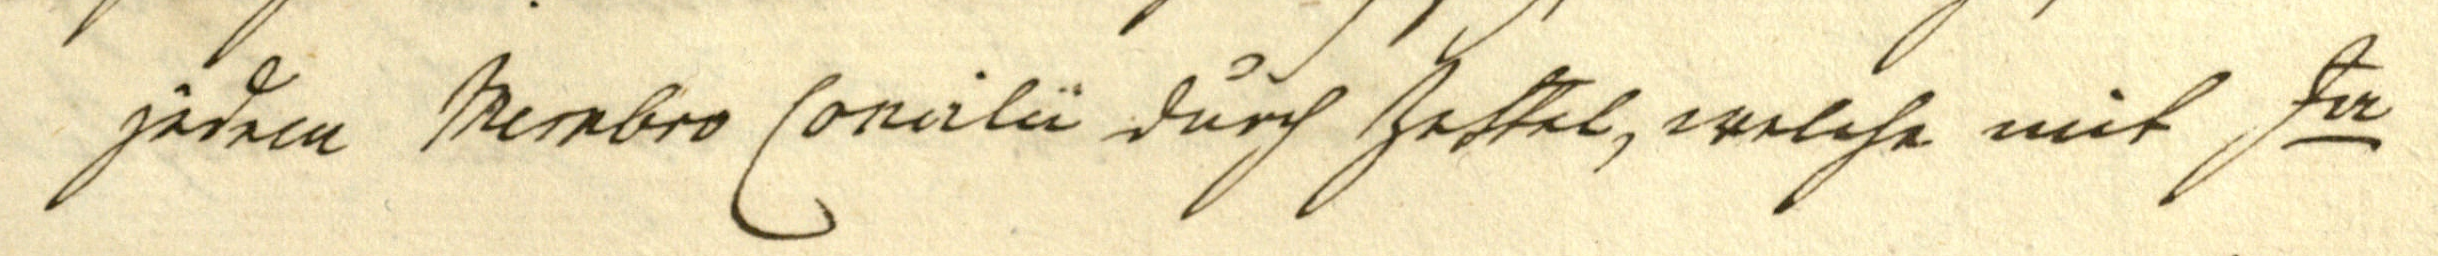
jedem Membro Concilii durch Zettel, welche mit Ja
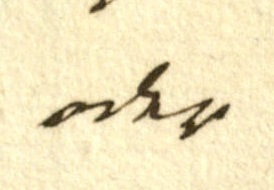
oder
